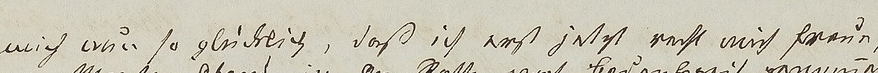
mich nun so glücklich, daß ich erst jetzt recht mich freue,
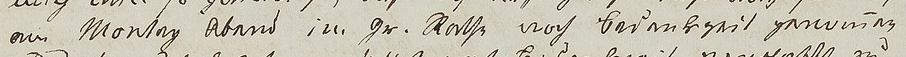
am Montag Abend im Gr. Rathe noch Bedenkzeit genommen
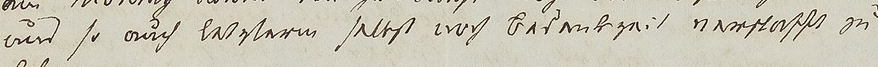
und so auch letzterm selbst noch Bedenkzeit verschafft zu
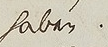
haben.
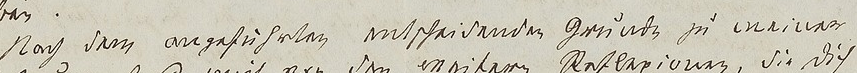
Nach dem angeführten entscheidenden Grunde zu meiner
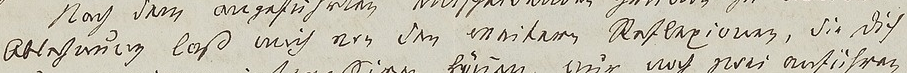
Ablehung laß mich von den weitern Reflexionen, die Dich
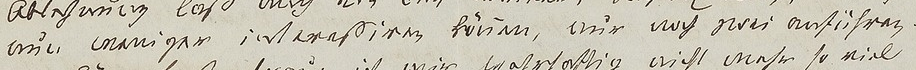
nun weniger interessiren können, nur noch zwei anführen.
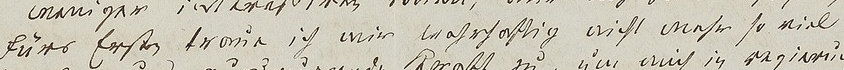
Fürs Erste traue ich mir wahrhaftig nicht mehr so viel
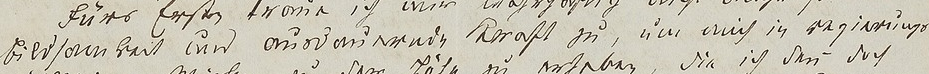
Bildsamkeit und ausdauernde Kraft zu, um mich in regierungs-
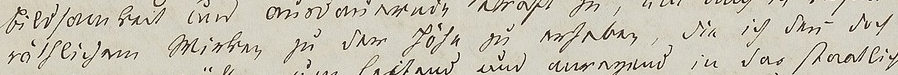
räthlichem Wirken zu der Höhe zu erheben, die ich denn doch
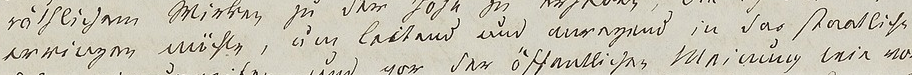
erringen möchte, um leitend und anregend in das staatliche
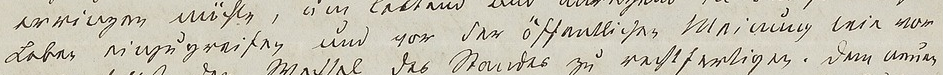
Leben einzugreifen und vor der öffentlichen Meinung wie vor
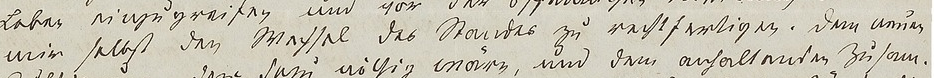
mir selbst den Wechsel des Standes zu rechtfertigen. Dem neuen
